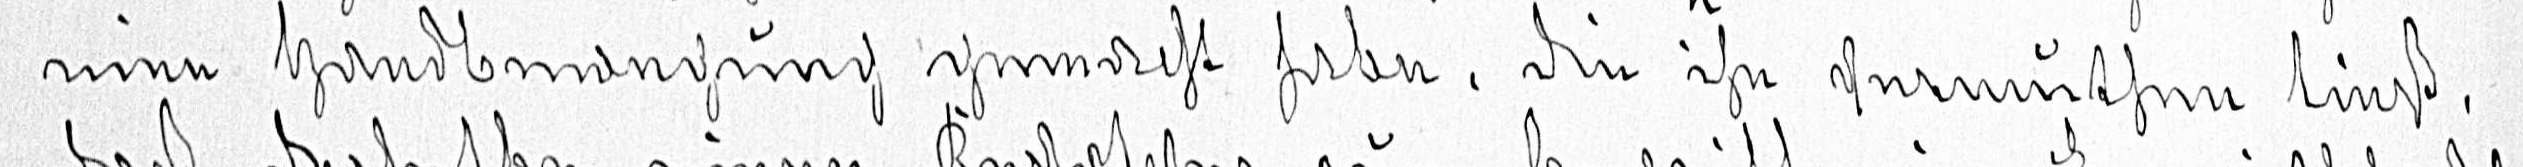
eine Handbewegung gemacht habe, die ihn vermuthen ließ,
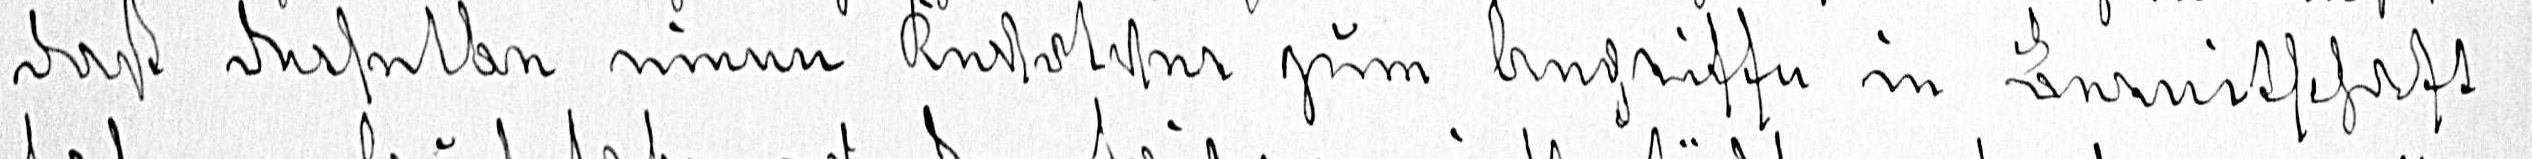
daß derselbe einen Revolver zum Angriffe in Bereitschaft
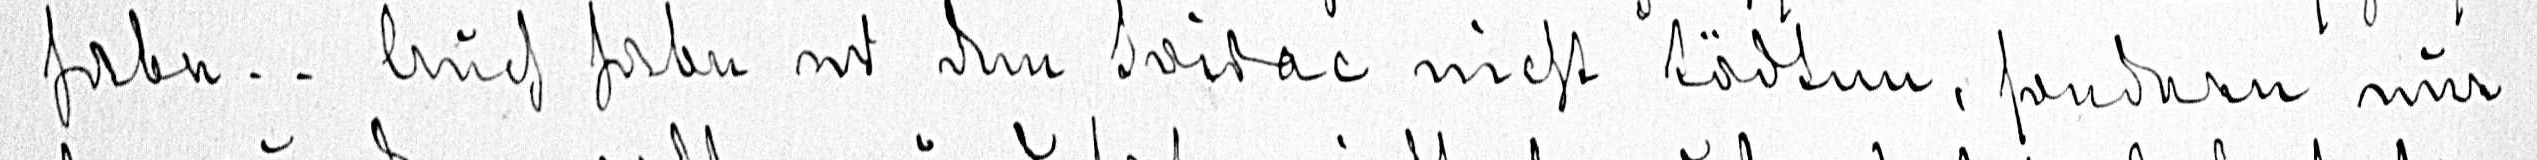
habe. Auch habe er den Svirac nicht tödten, sondern nur
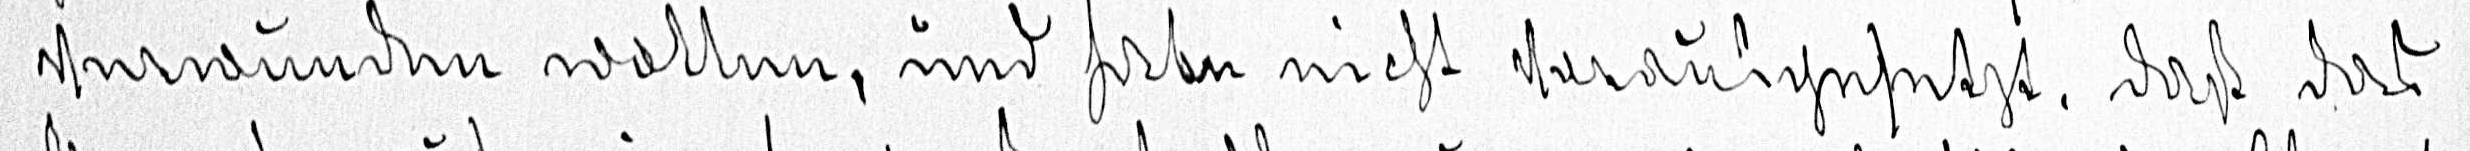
verwunden wollen, und habe nicht vorausgesetzt, daß das
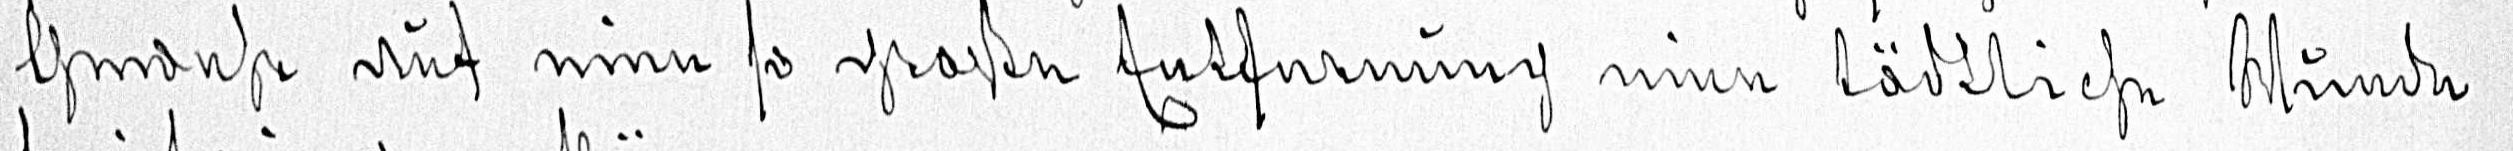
Gewehr auf eine so große Entfernung eine tödtliche Wunde
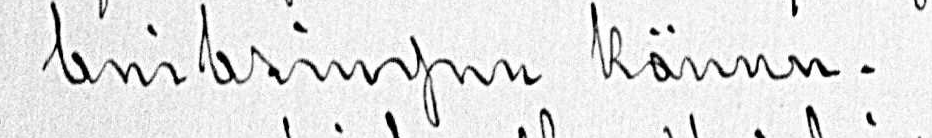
beibringen könne.
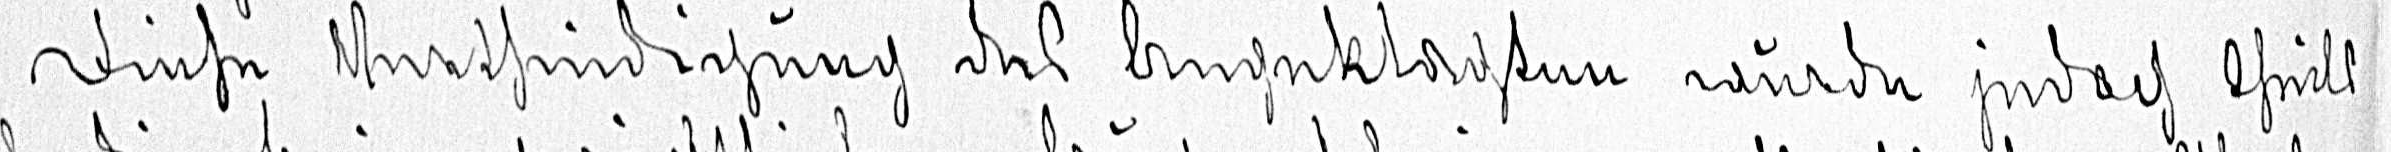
Diese Vertheidung des Angeklagten wurde jedoch theils
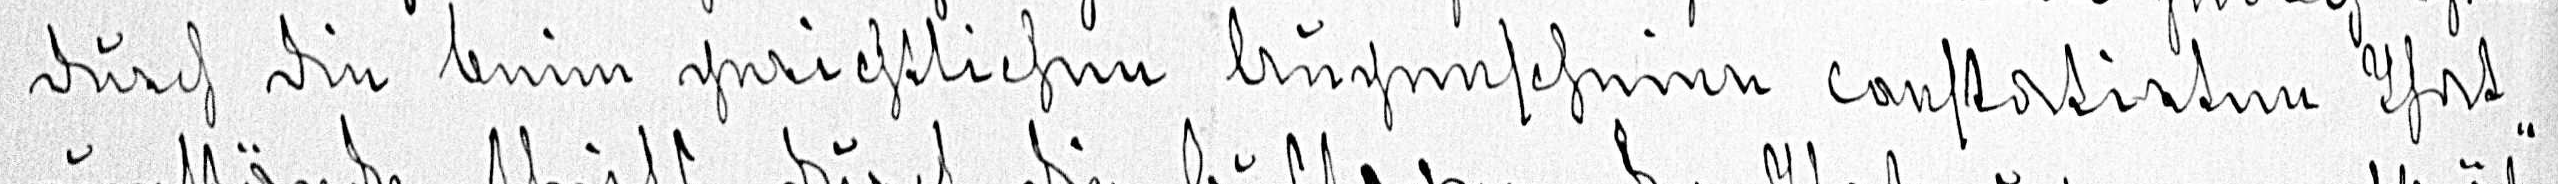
durch die beim gerichtlichen Augenscheine constatirten That¬
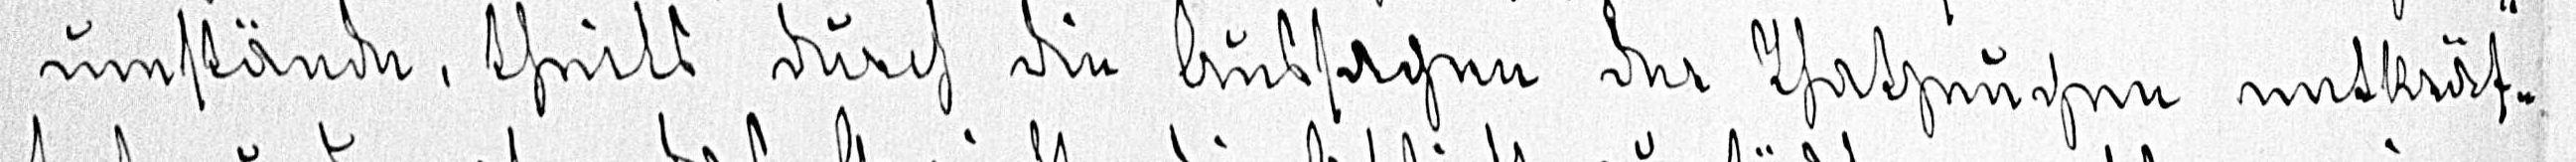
umstände, theils durch die Aussagen der Thatzeugen entkräf¬
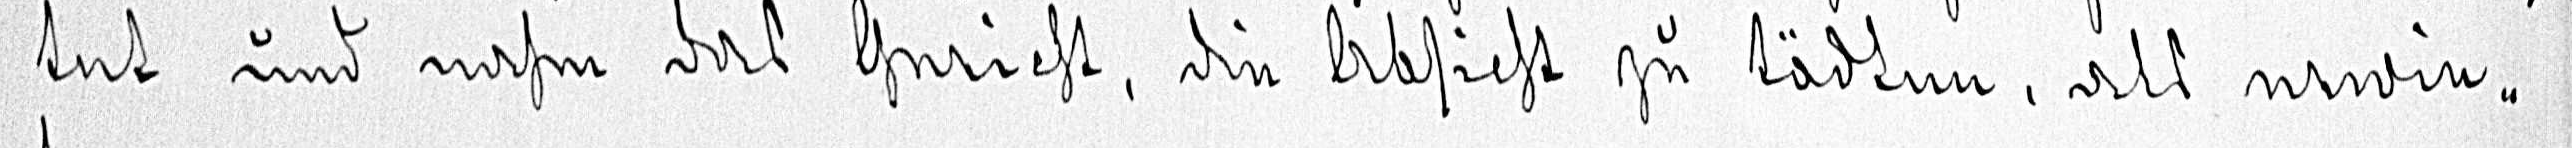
tet und nahm das Gericht, die Absicht zu tödten, als erwie¬
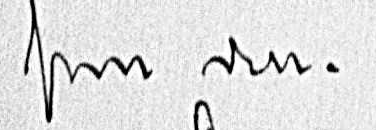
sen an.
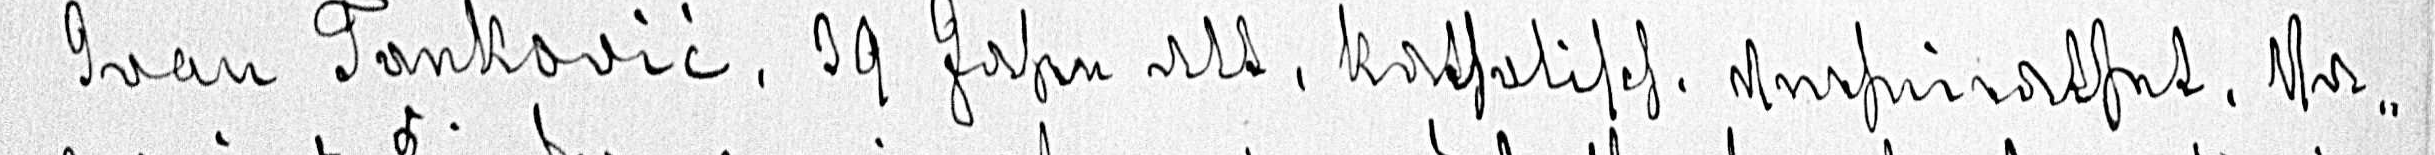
Ivan Tonković, 39 Jahre alt, katholisch, verheirathet, Va¬
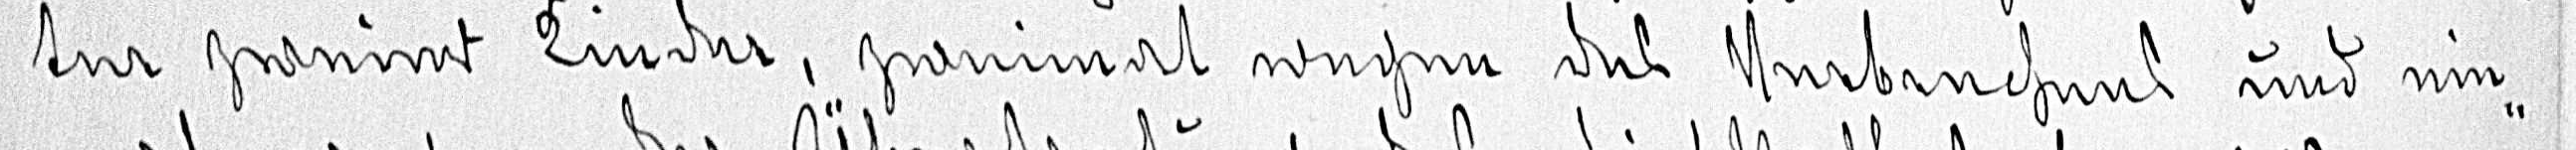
ter zweier Kinder, zweimal wegen des Verbrechen und ein¬
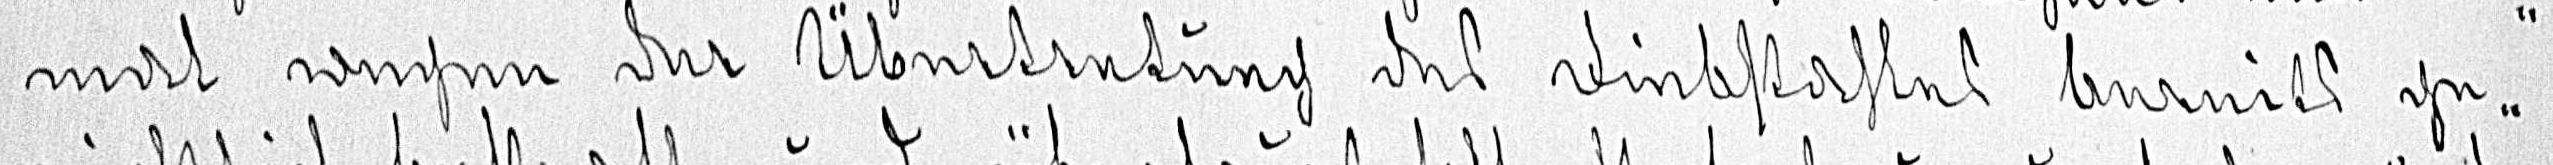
mal wegen der Übertretung des Diebstahles bereits ge¬
